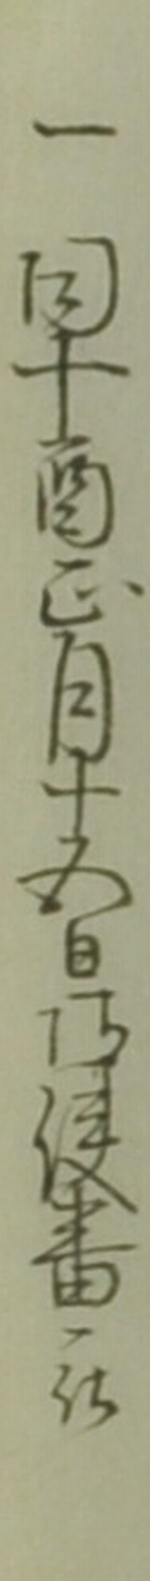一同十酉正月十五日御使番被
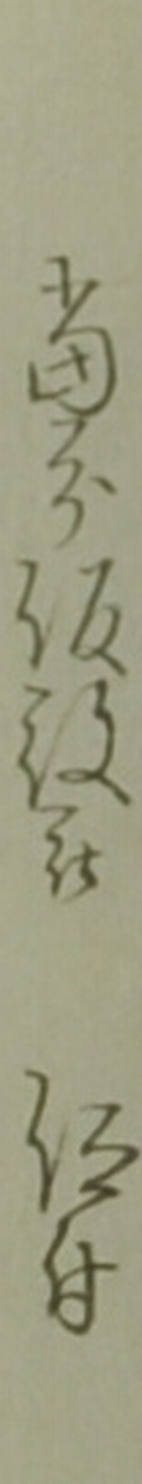当分仮役被仰付

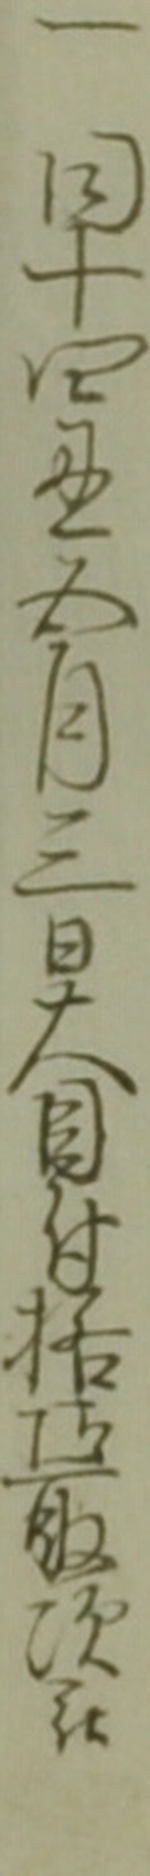一同十四丑五月三日大目付格御取次被
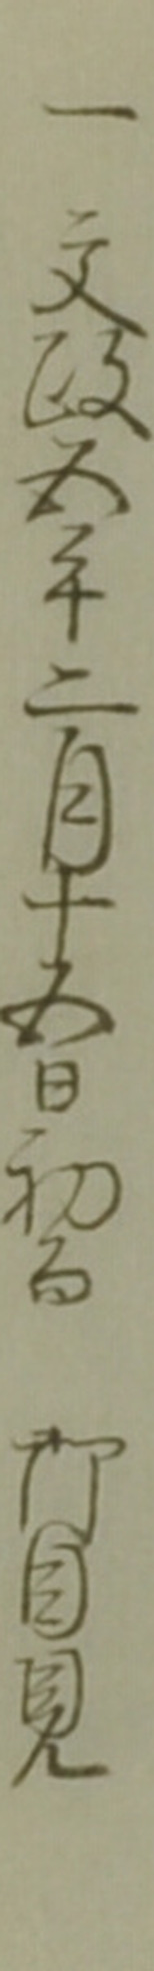一文政五午二月十五日初而御目見
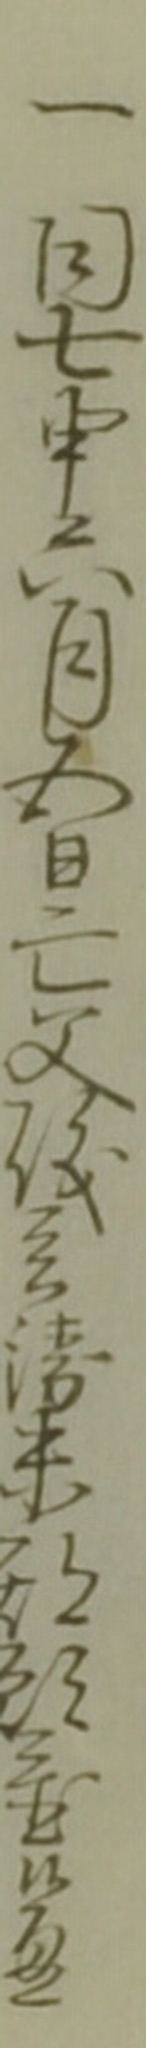一同七申六月五日亡父儀兵衛末期願置候通
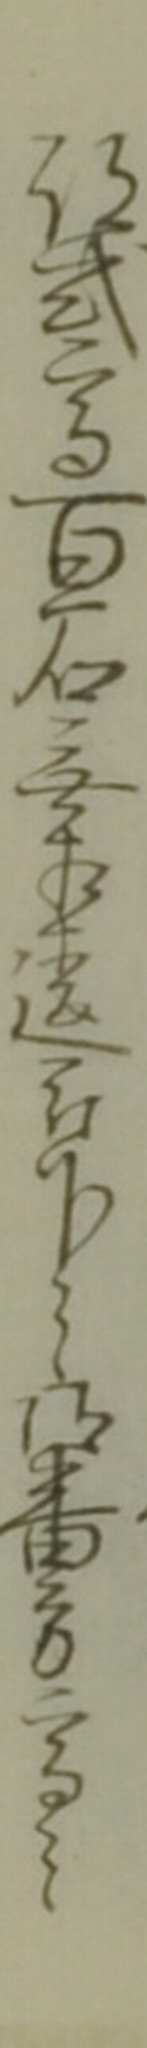跡式高百石無相違被下之御番方高之
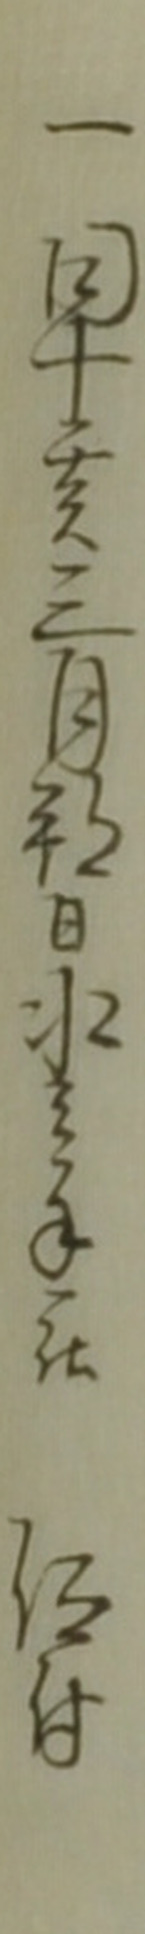一同十亥三月朔日水之手被仰付
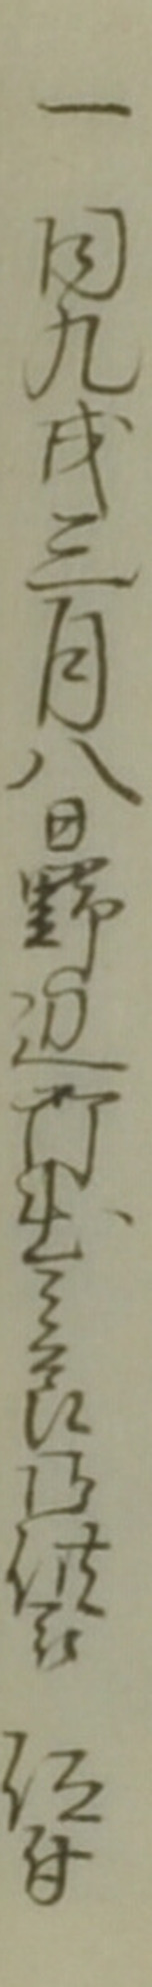一同九戌三月八日野辺御出之節御供被仰付
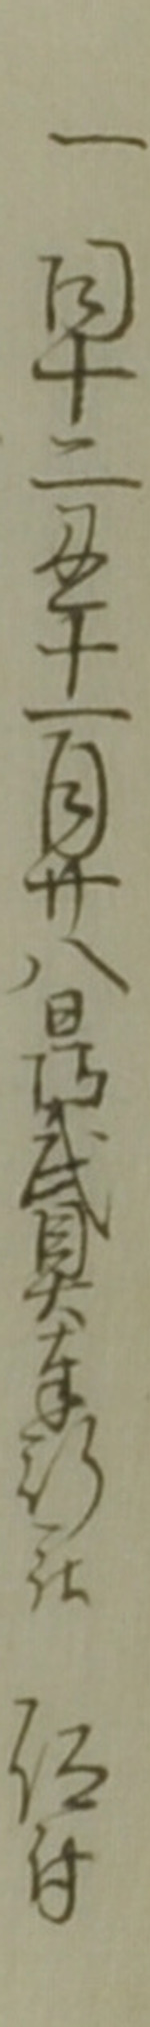一同十二丑十一月廿八日御武具奉行被仰付
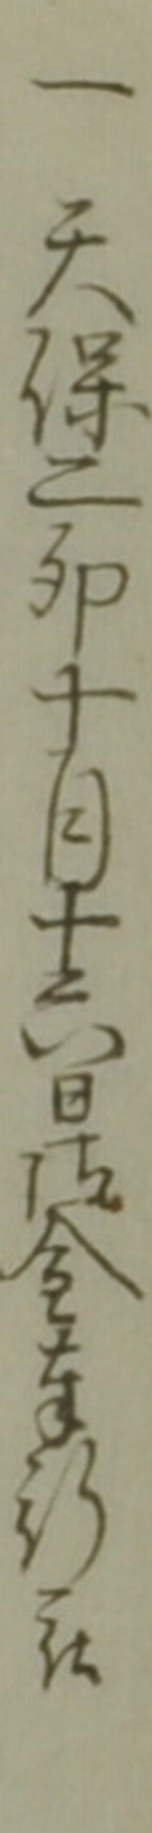一天保二卯十月十六日御金奉行被
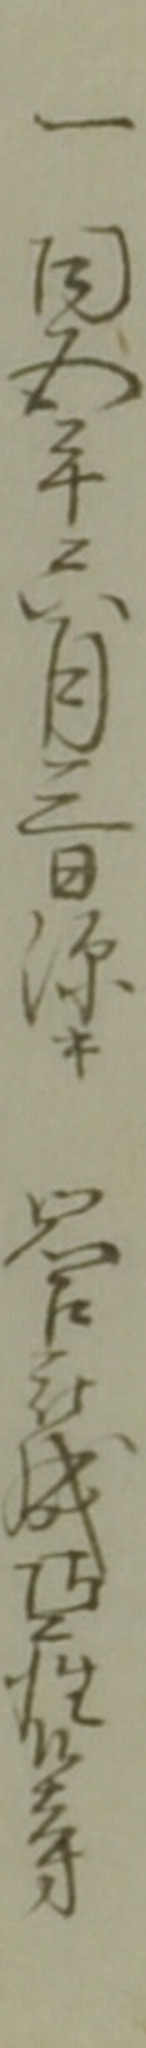一同五午六月三日深キ思召被成御座候旁
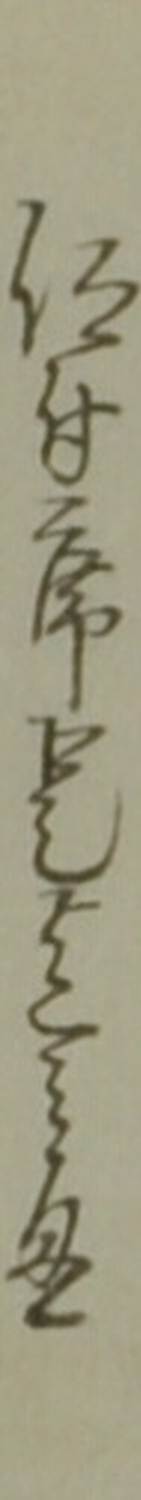仰付席是迄之通
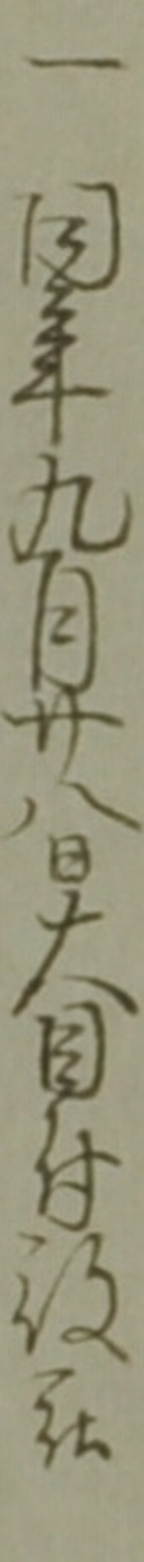一同年九月廿八日大目付役被
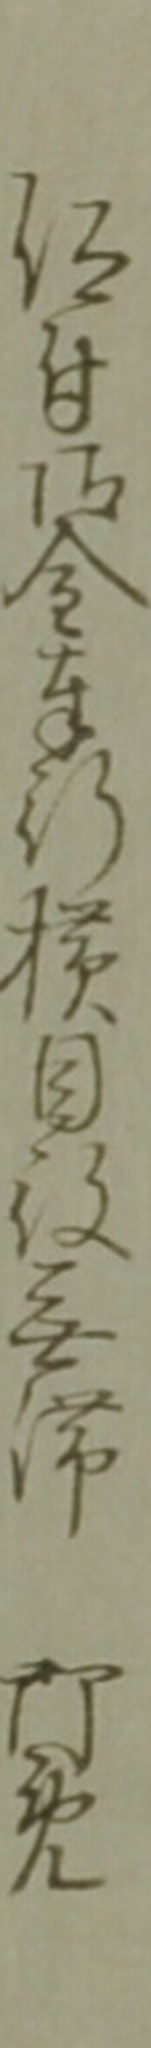仰付御金奉行横目役無滞御免
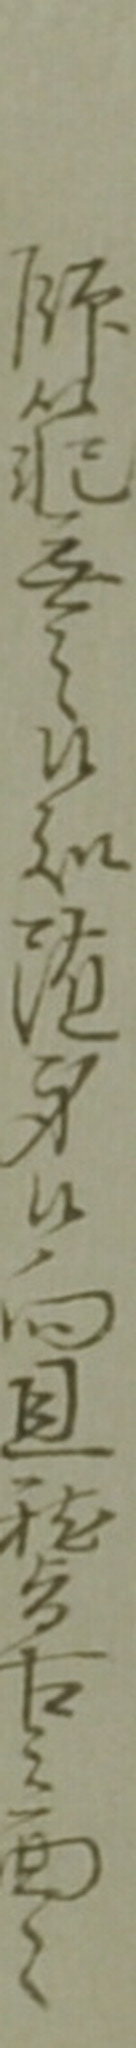師範無之候処随身候向且稽古之面々
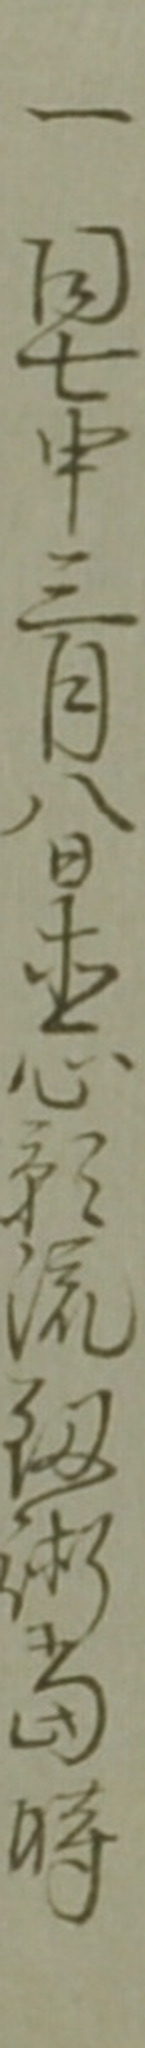一同七申三月八日直心影流釼術当時
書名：給人諸士勤仕録（三）
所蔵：伊那市立高遠町図書館・合同会社AMANE
